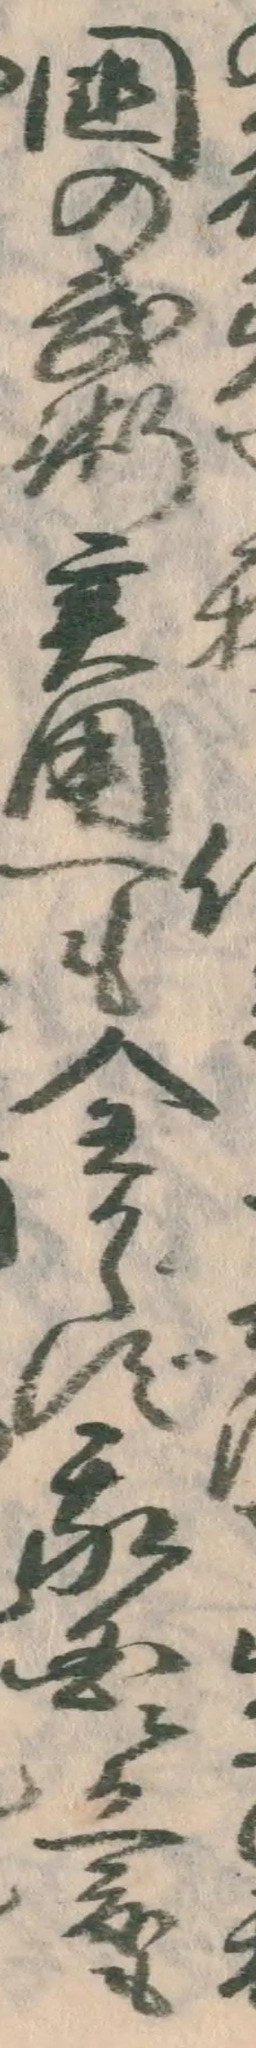國の武術実用へも全からず我国ニ而一度も
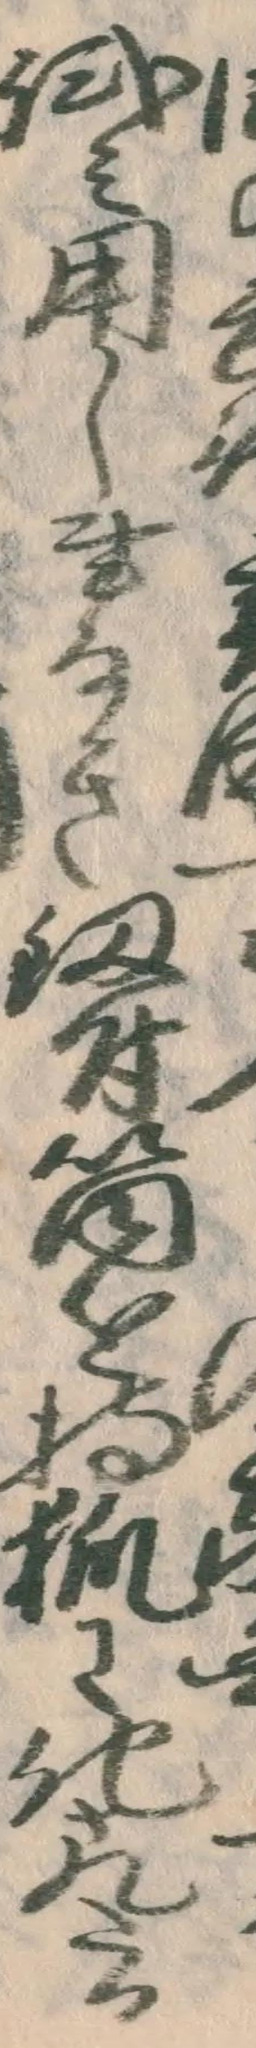試ミ用し事なき剱付筒を持狐に化されたる
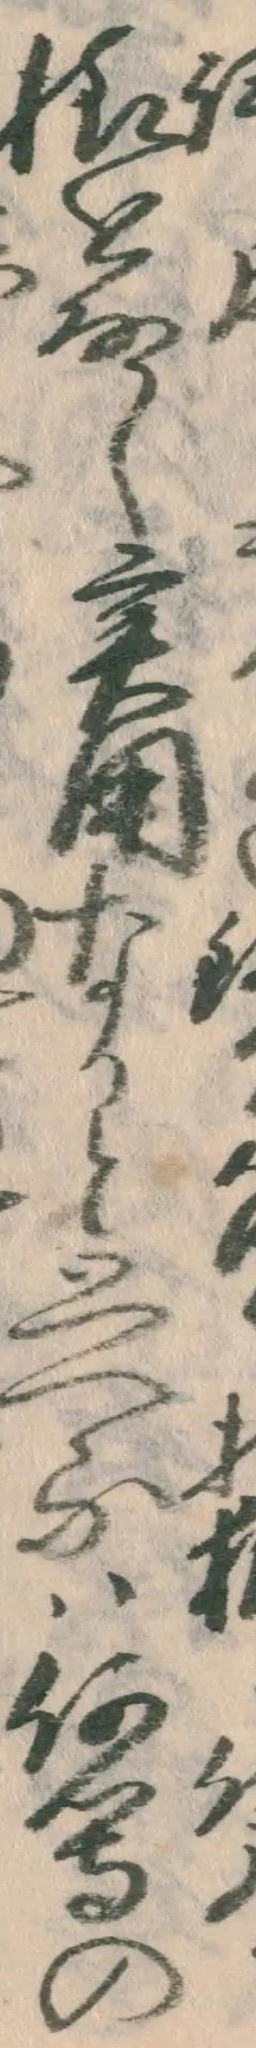様をなし実用なりと思へるハ何等の
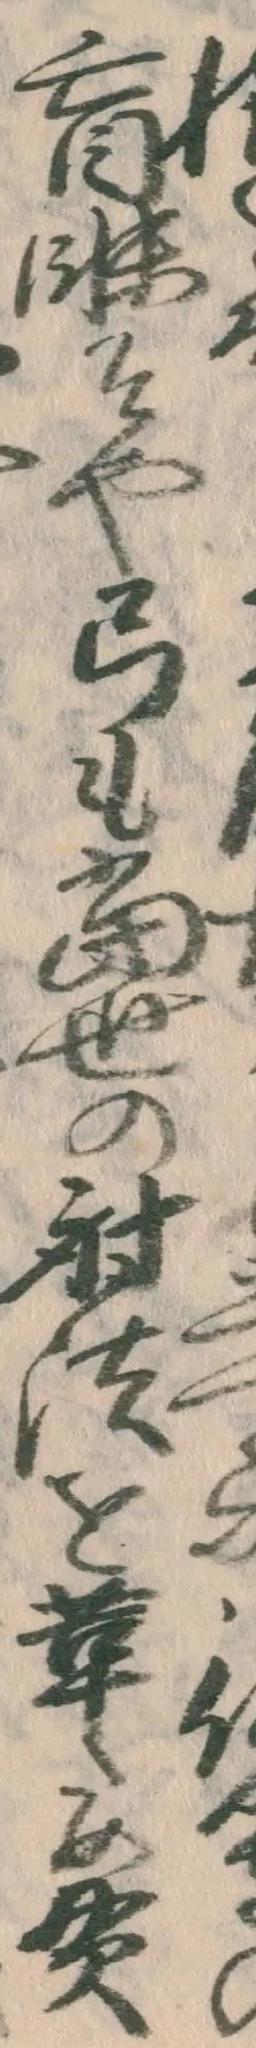盲昧そや弓も當世の射法を革ため貫
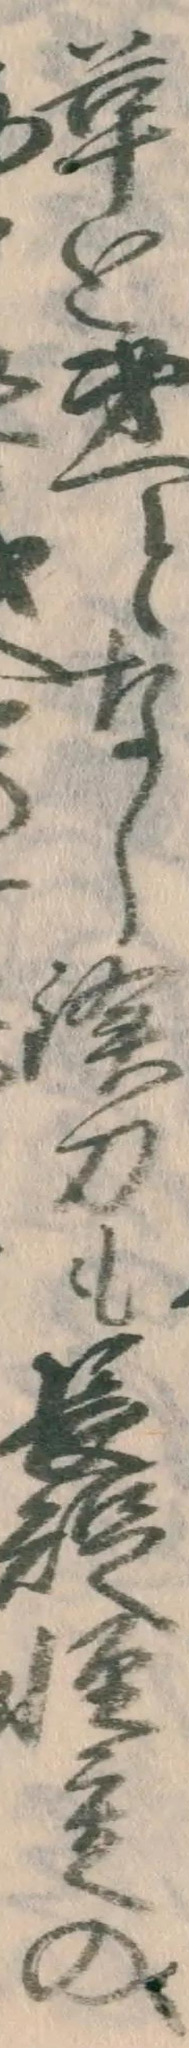革を第一となし鎗刀も長短軽重の
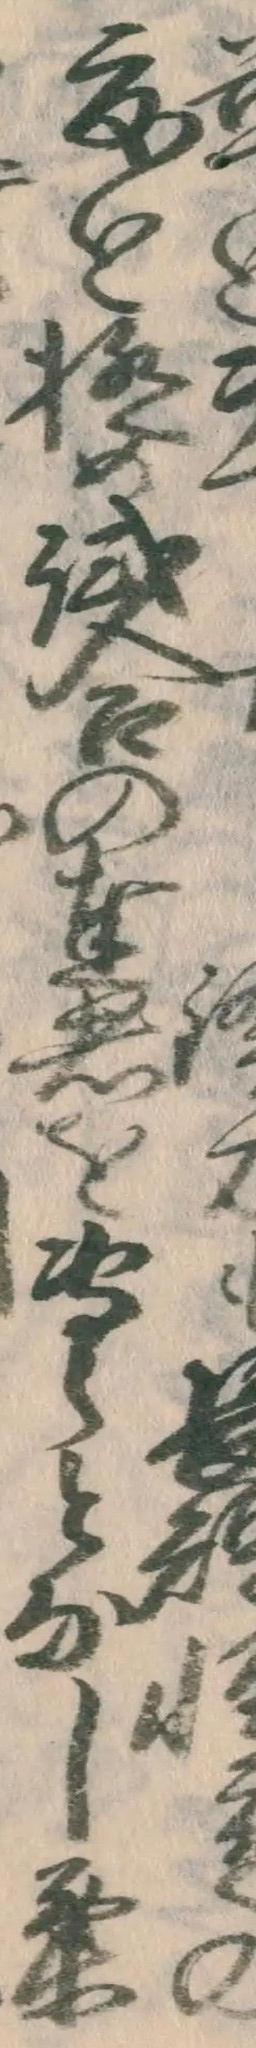度を極め試合の達者を専らとなし柔
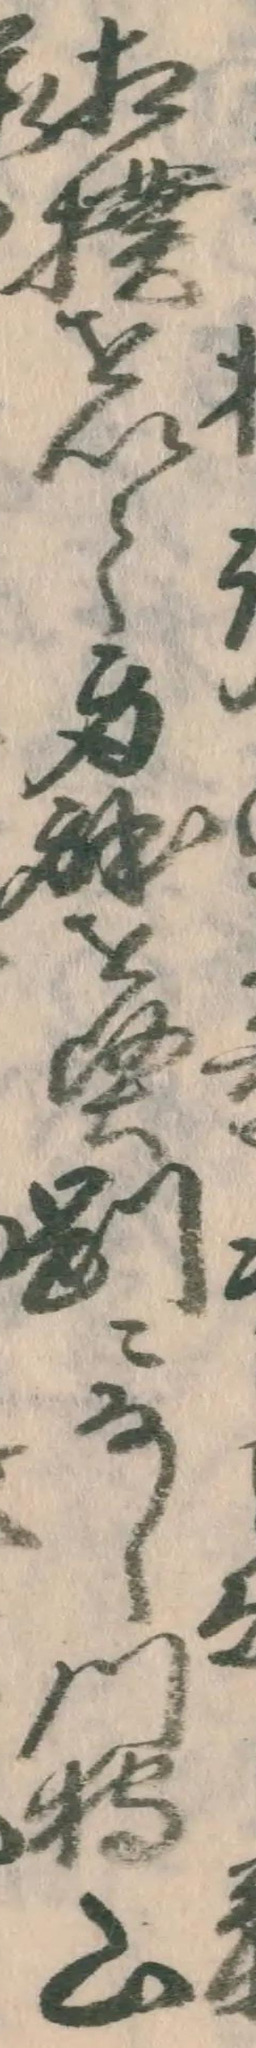相撲を以て身躰を堅剛ニなし御狩山
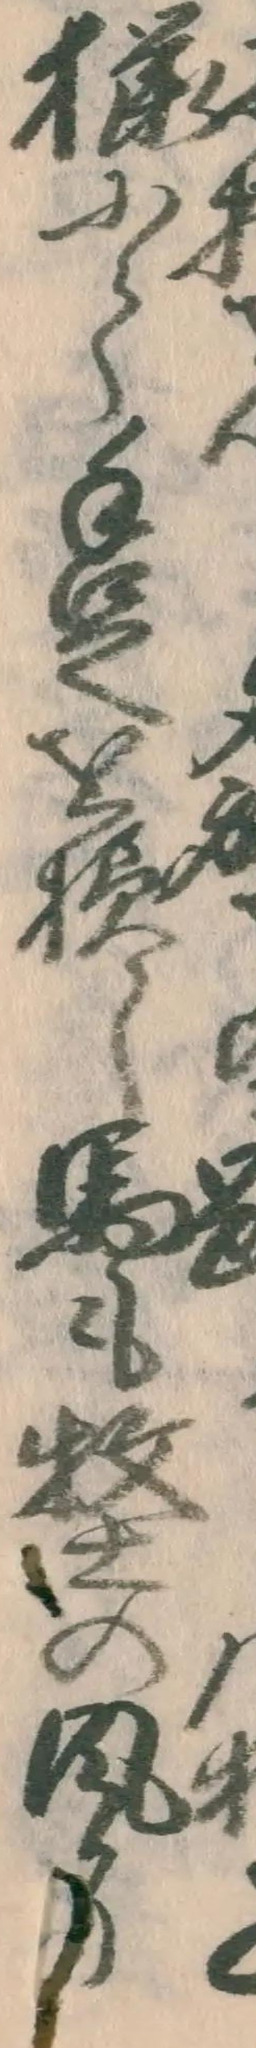猟にて手足を損し馬も牧士の風に
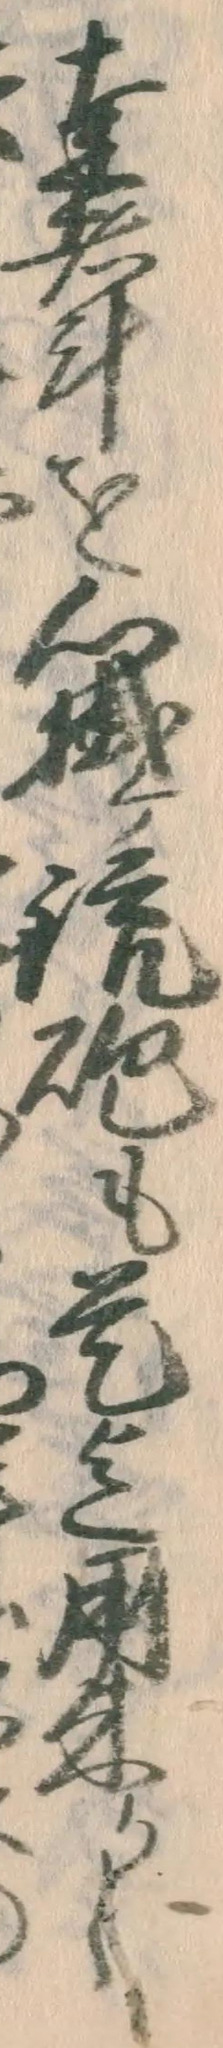達者斗を心掛ケ銃砲も是迄用来りし
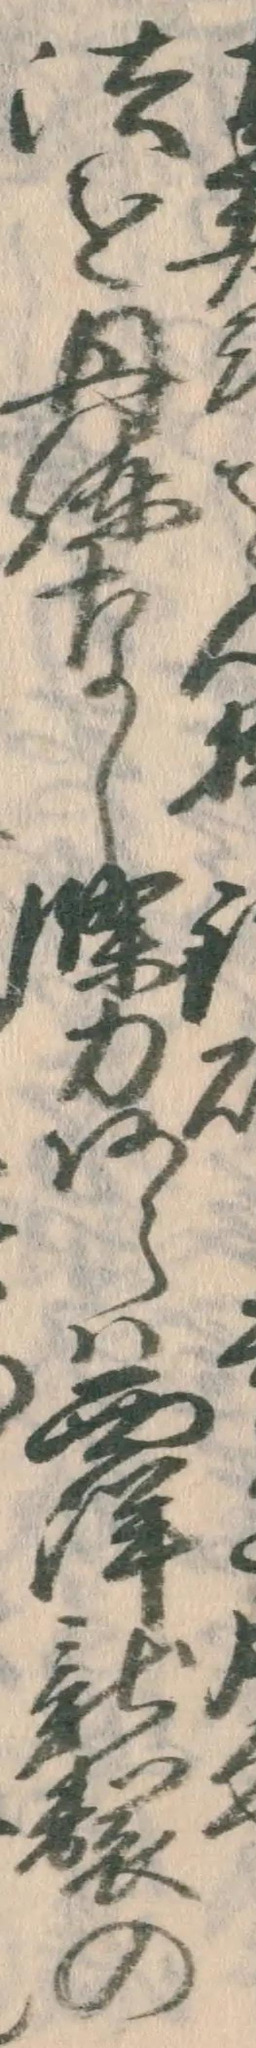法を丹練なし餘力あらハ西洋新製の
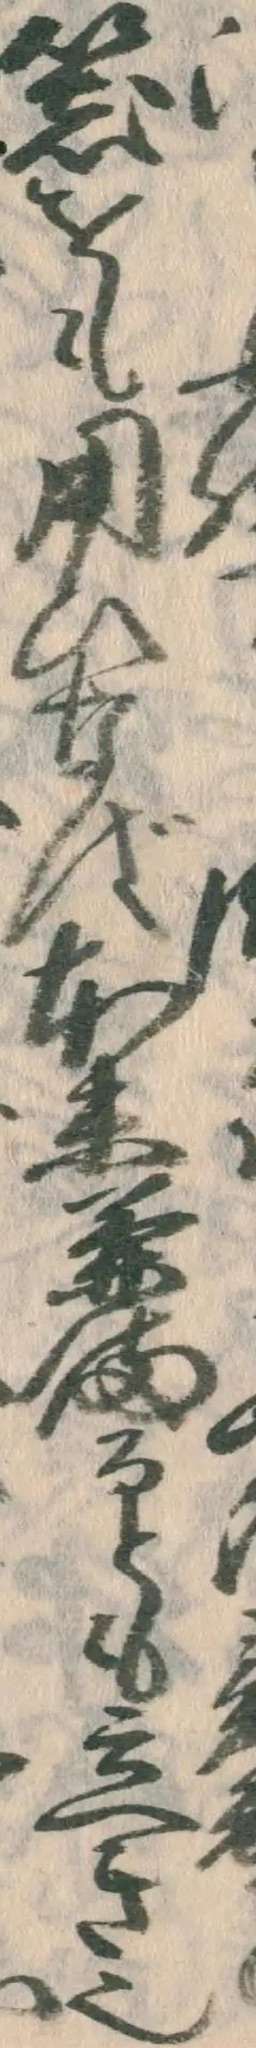器をも用ひなば本末兼備るとも云へき也
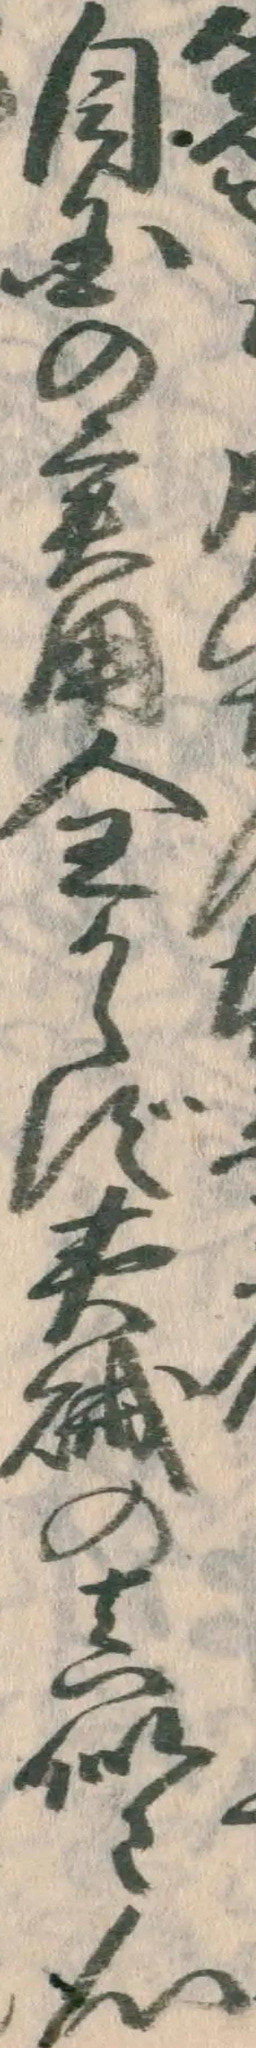自国の実用全からず夷賊の真似ニ心
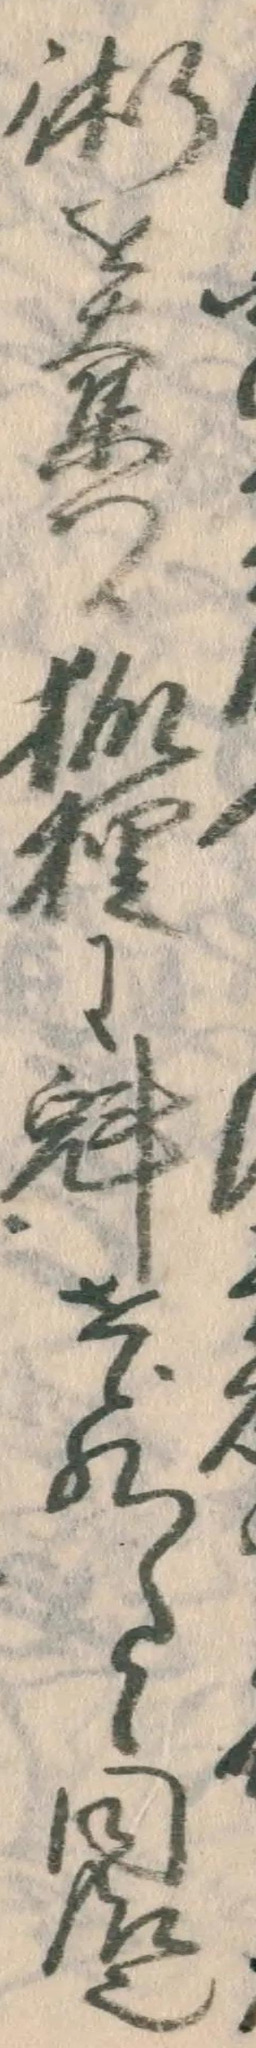術を奪ハる狐狸に魅せられしと同様也
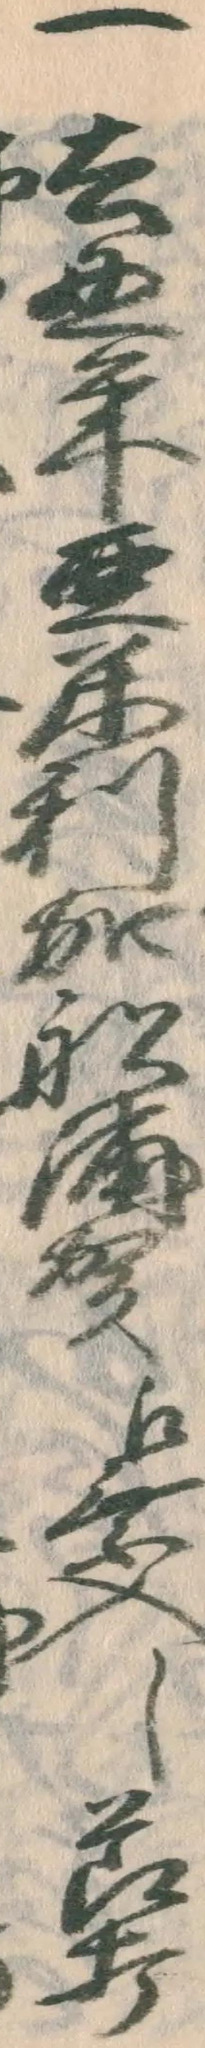一去丑年亜米利加船浦賀江乗入し節打
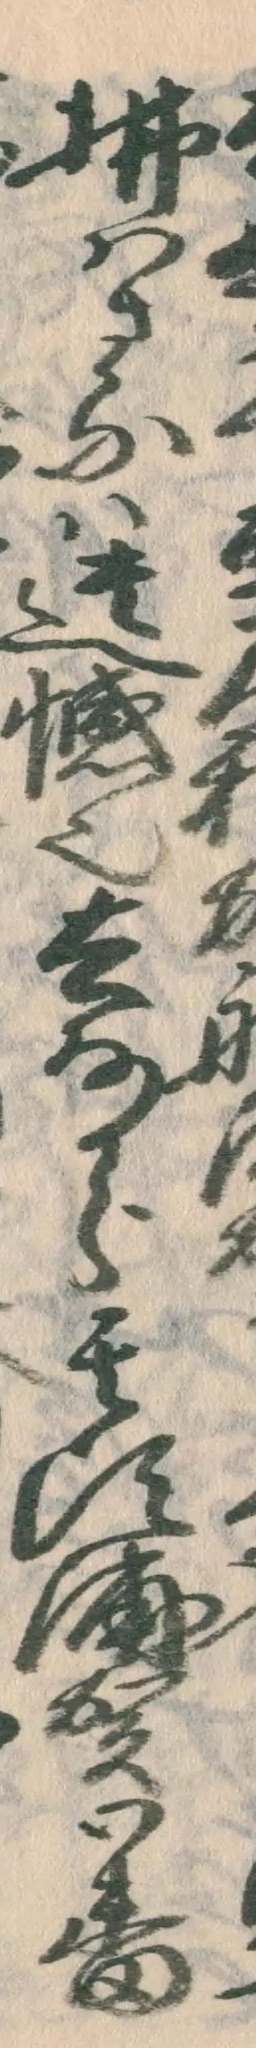拂ハさるハ遺憾也去なから其頃浦賀御番
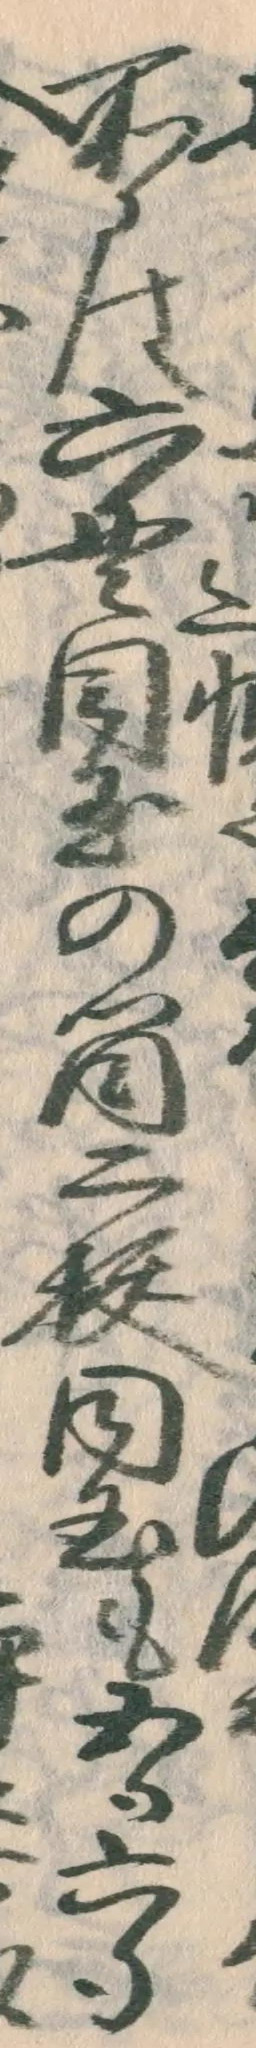所には六貫目玉の筒二挺同玉も五ツ六ツ
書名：麗斎叢書. 20
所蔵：国立国会図書館 National Diet Library, JAPAN
